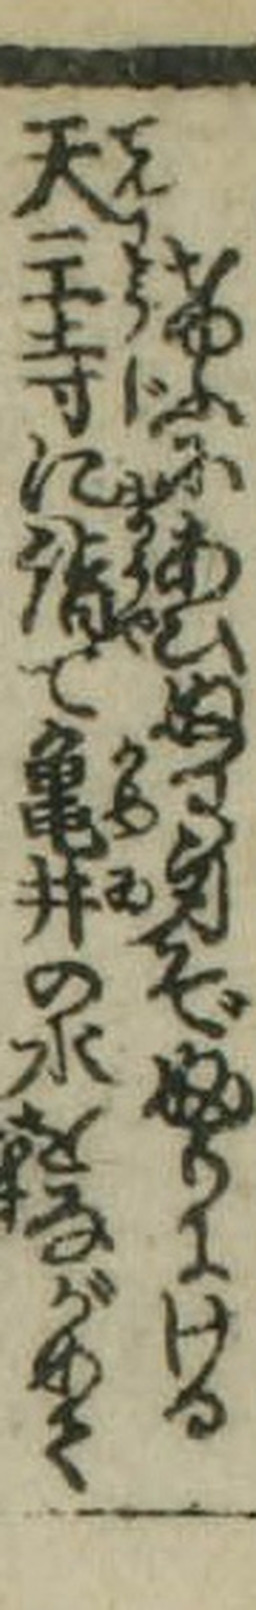天王寺に詣て亀井の水をながめて
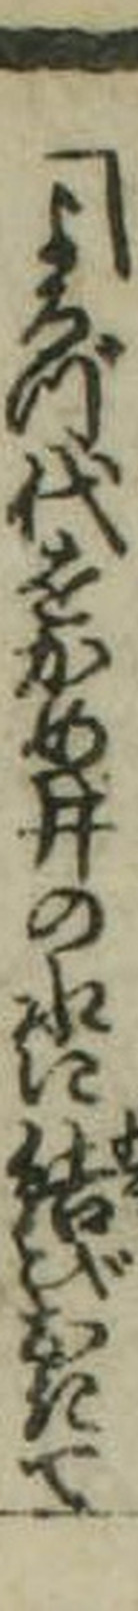〽よろづ代をかめ井の水に結びおきて
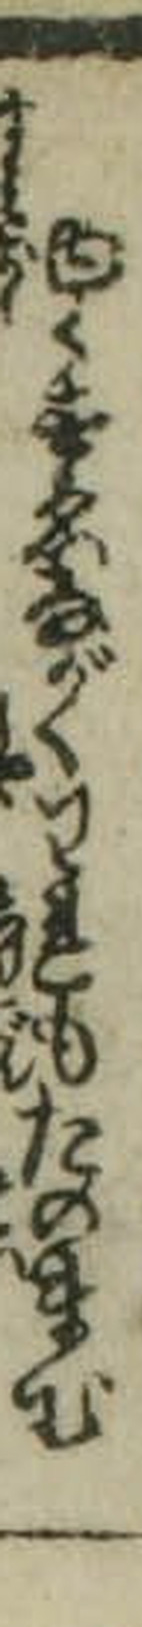ゆくすゑながくわれもたのまむ
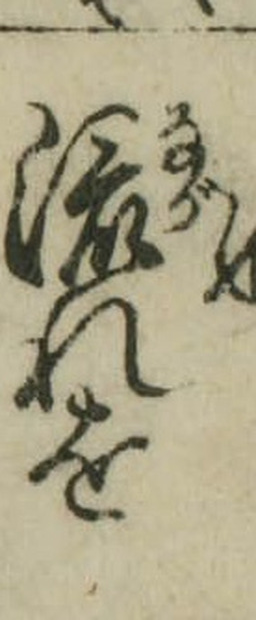流れを
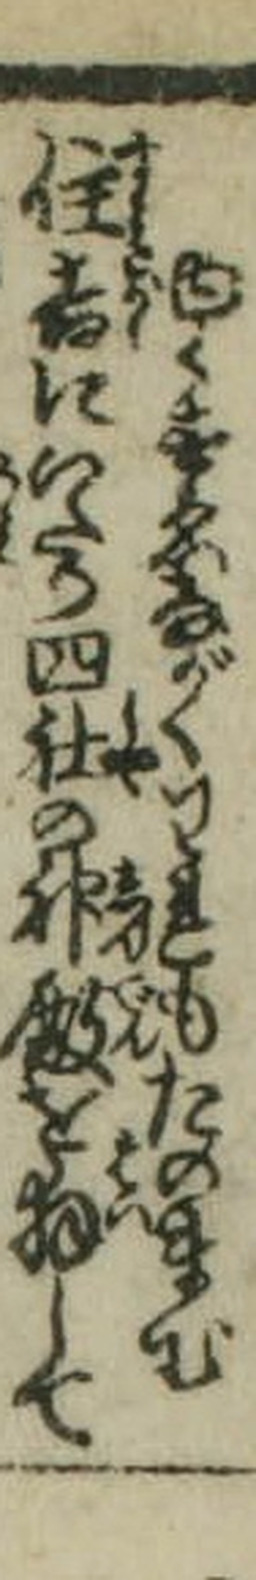住吉にいたり四社の神殿を拝して
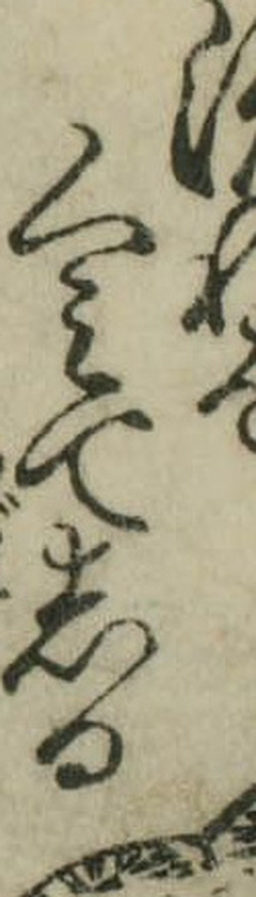くみてしる
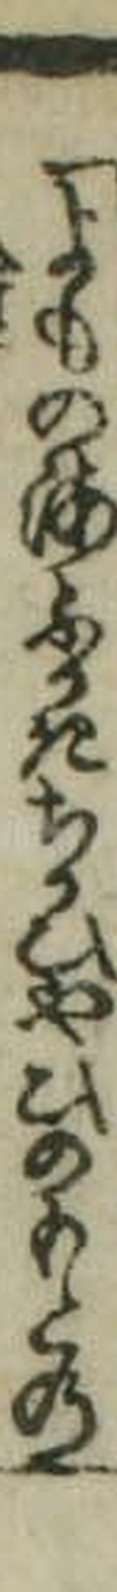〽よもの海ふかきちかひやひのもとの
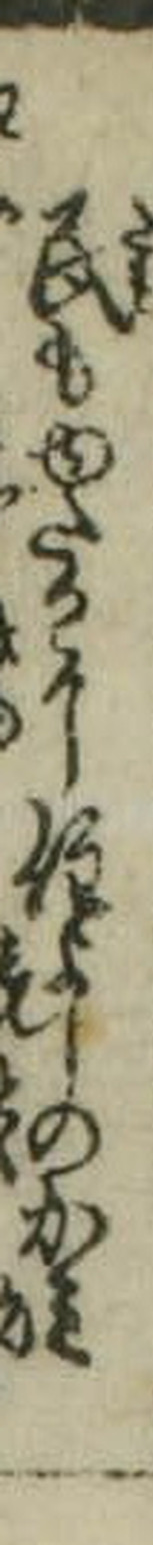民もゆたかに住よしのかみ
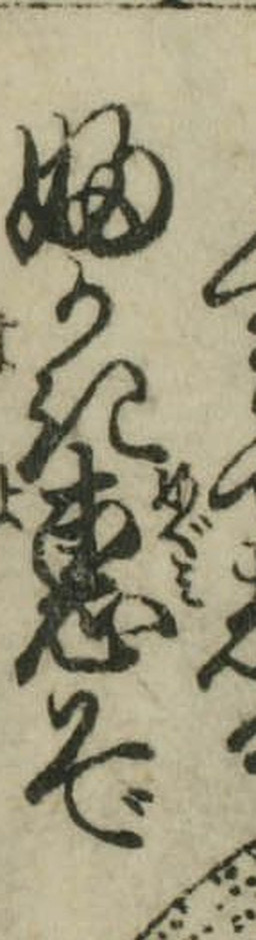ふかき恵ぞ
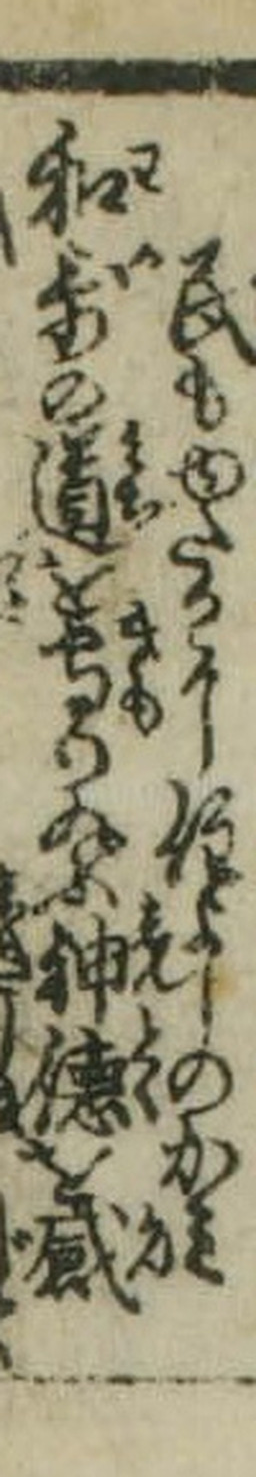和哥の道を守り給ふ神徳を感じて
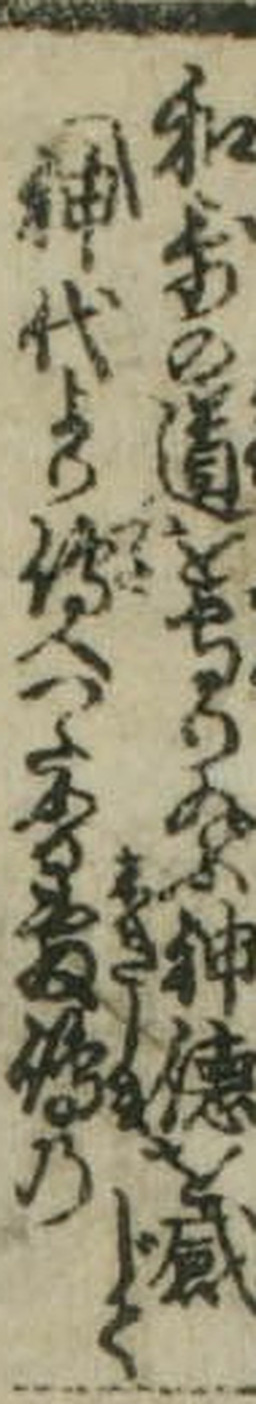〽神代より伝へつたふる敷嶋の
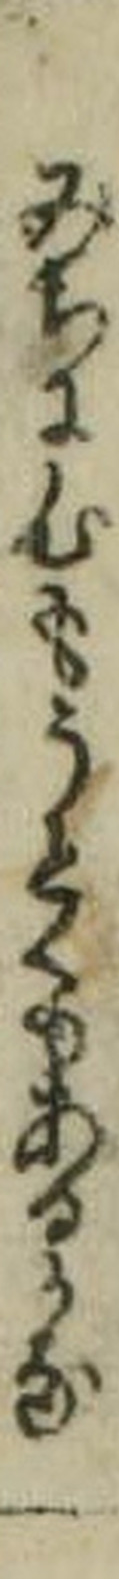みちに心もうとくもあるかな
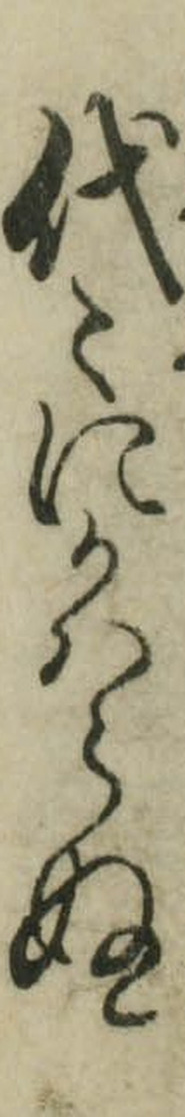代々にかはらぬ
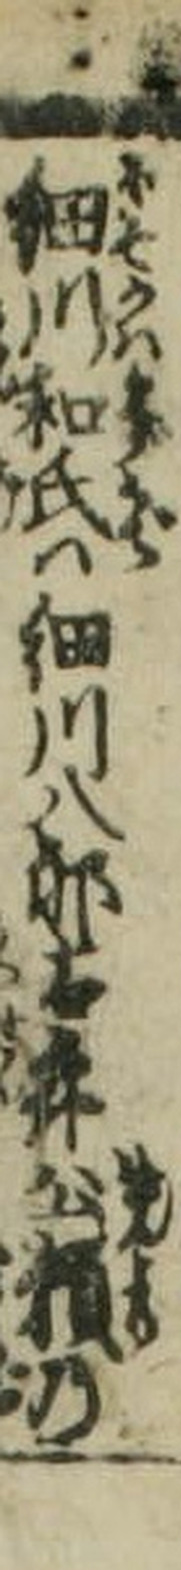細川和氏は細川八郎太郎公頼の
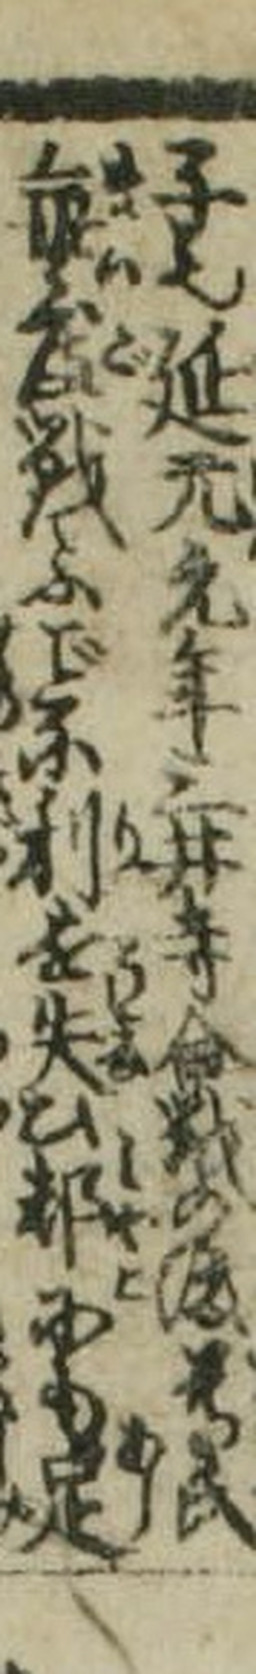毎度戦ふごとに利を失ひ都にも足
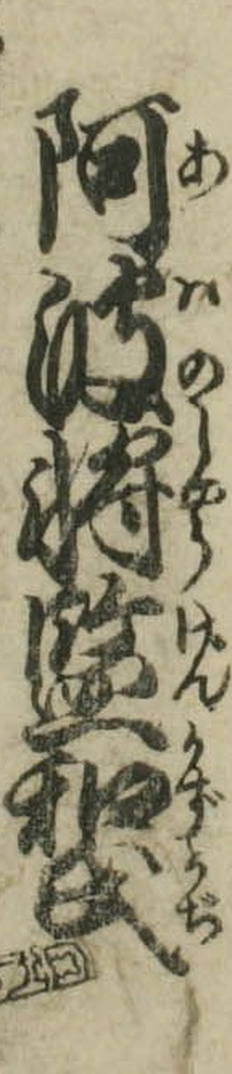阿波将監和氏
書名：續英雄百人一首
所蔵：東京学芸大学附属図書館
